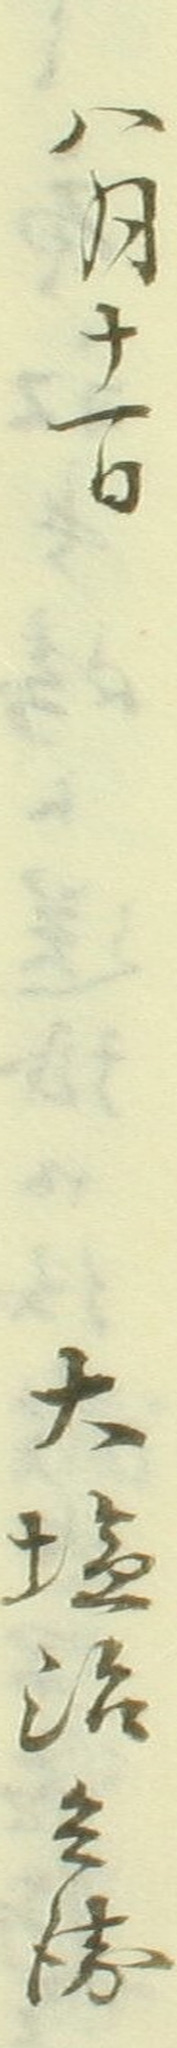八月十一日大塩治兵衛
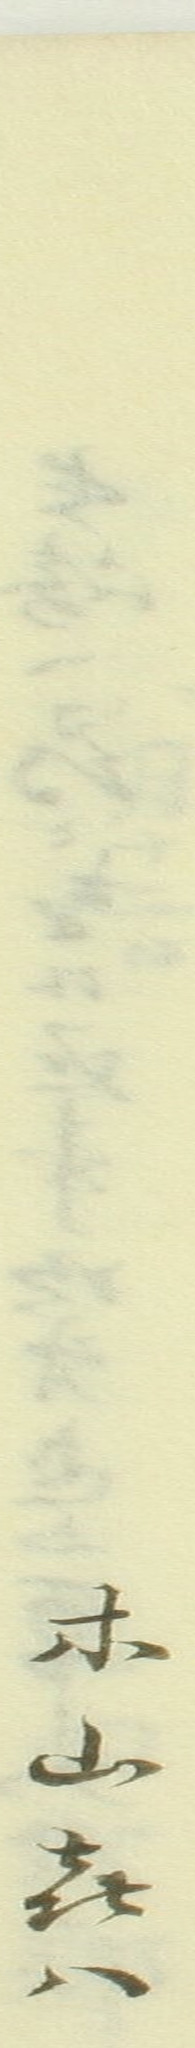木山喜八
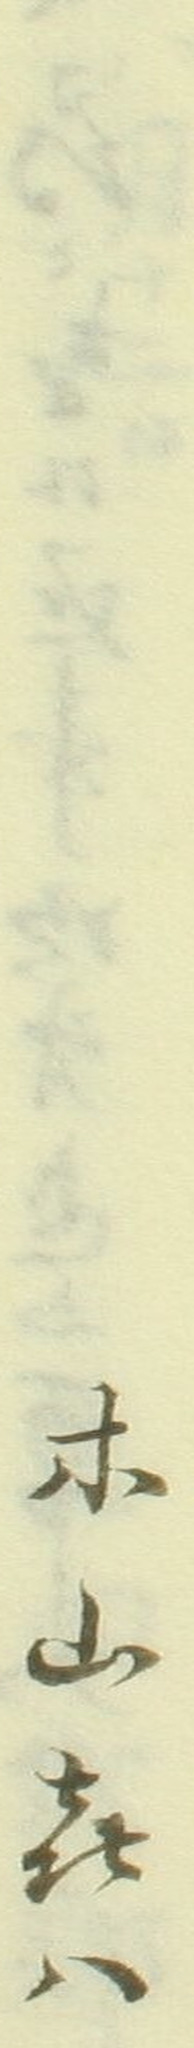木山喜八
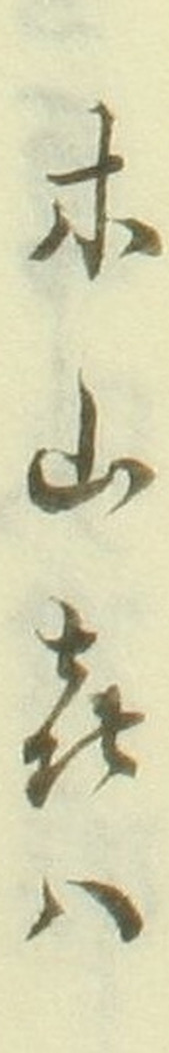木山喜八
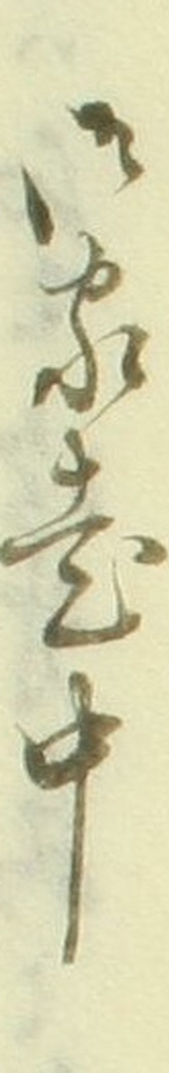御家老中
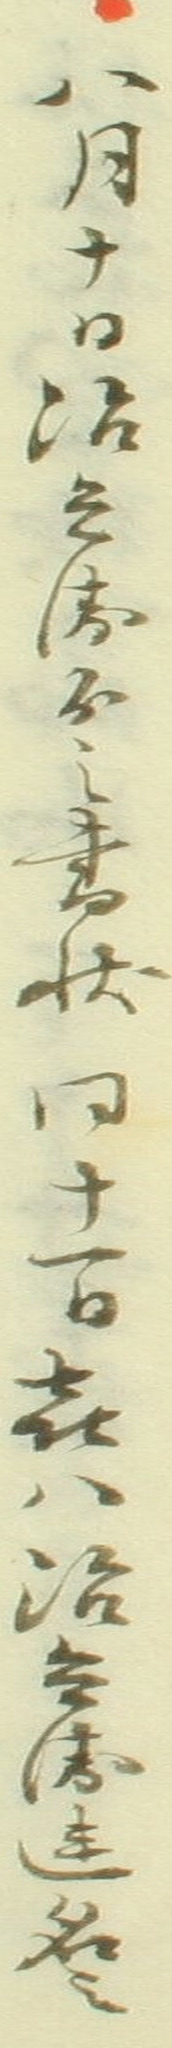八月十日治兵衛ゟ之書状同十一日喜八治兵衛連名之
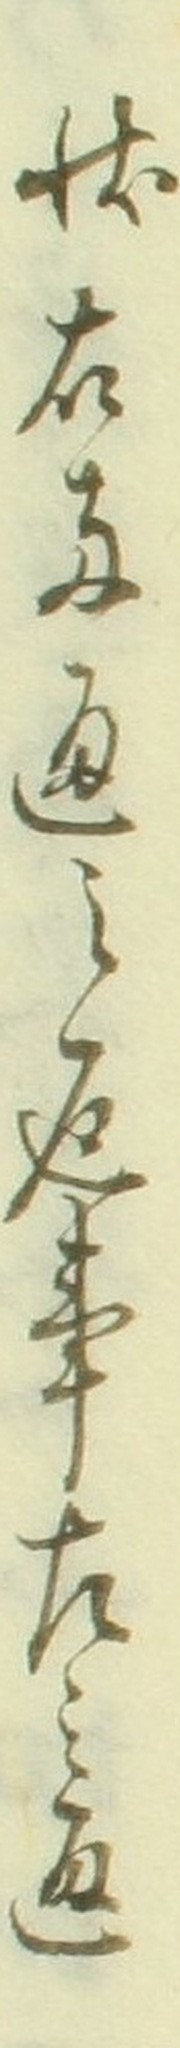状右両通之返事左之通
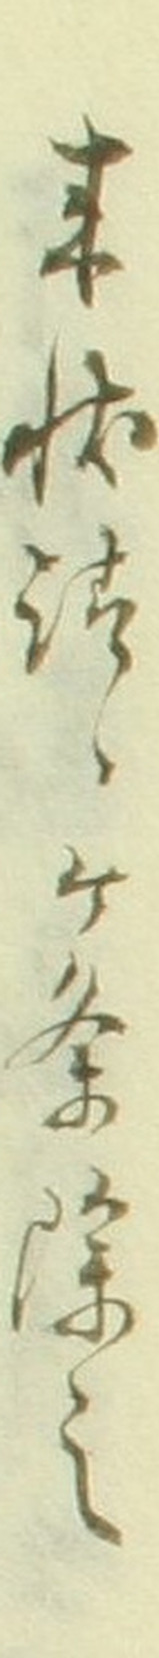来状様々ヶ条除之
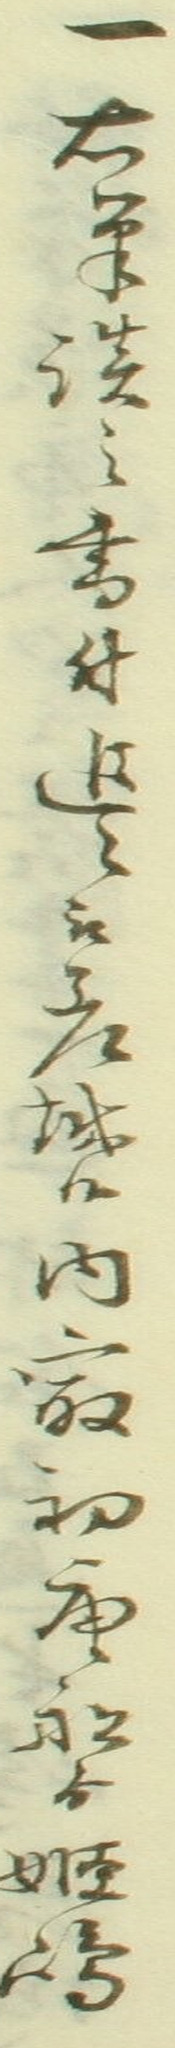一右筆談之書付追々被差越候内最初唐船ゟ姫島
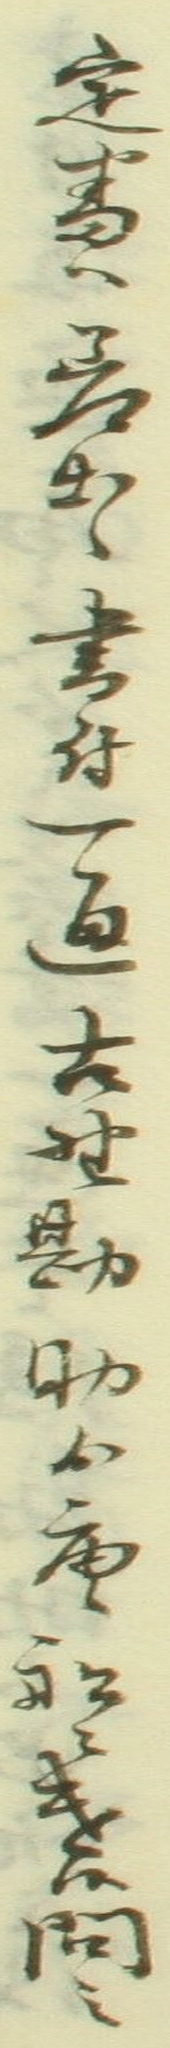定番へ差出候書付一通古野勘助ゟ唐船に遣候問之

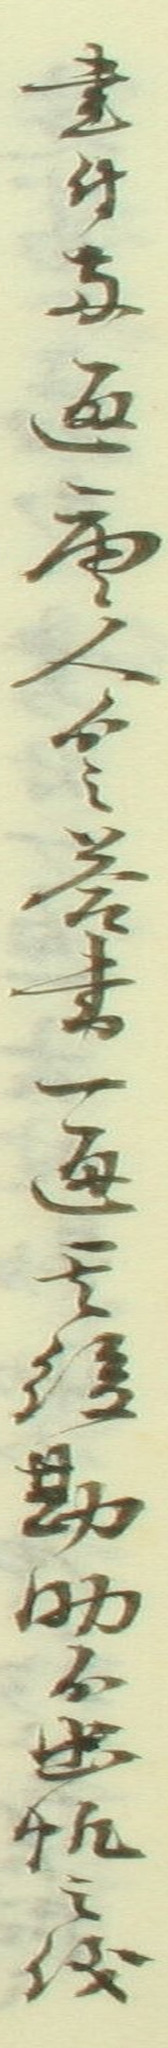書付両通唐人ゟ之答書一通其後勘助ゟ出帆之儀
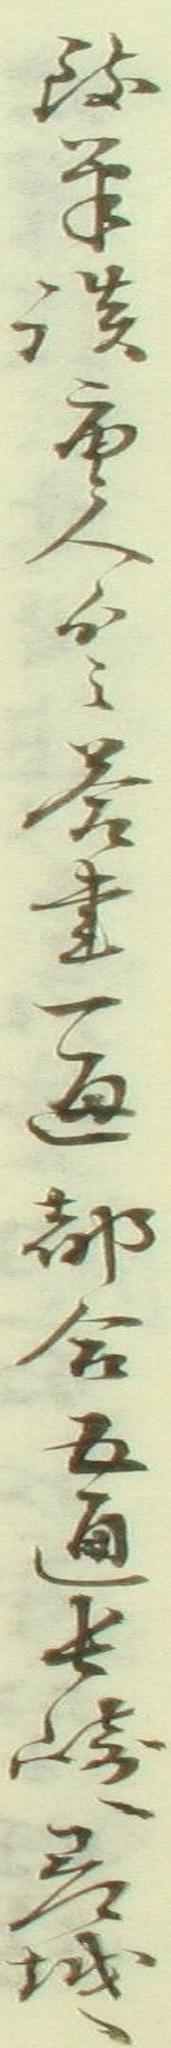致筆談唐人ゟ之答書一通都合五通長崎へ差越候
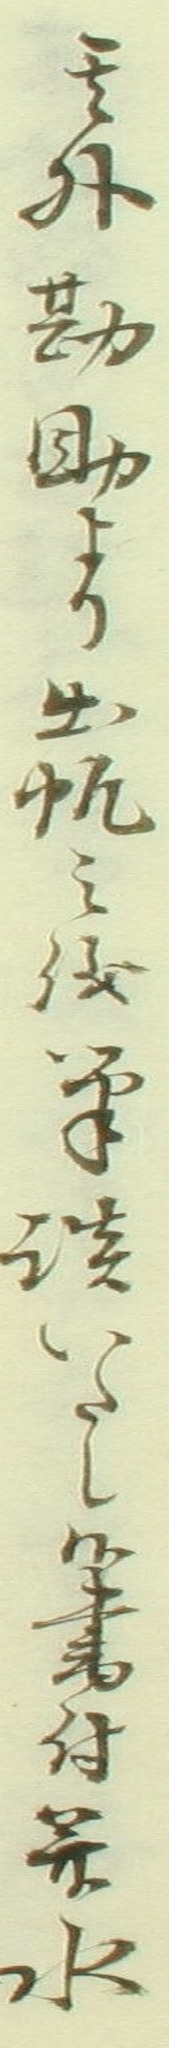其外勘助より出帆之儀筆談いたし候書付并水
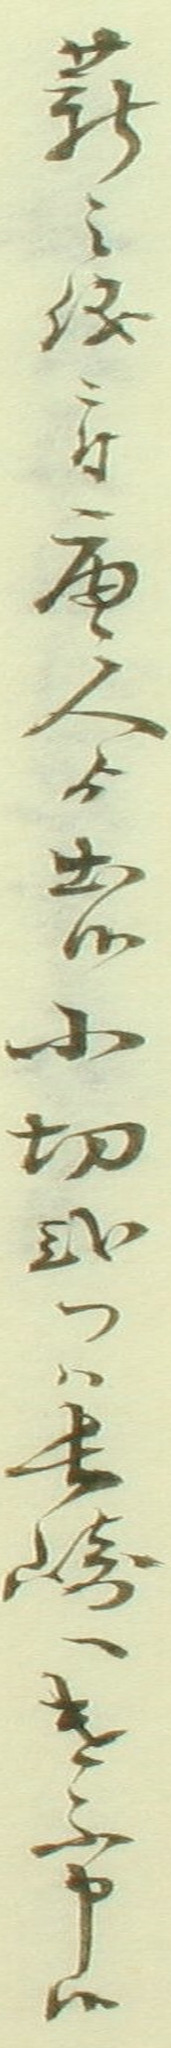薪之儀に付唐人ゟ出候小切弐つは長崎へ遣不申候
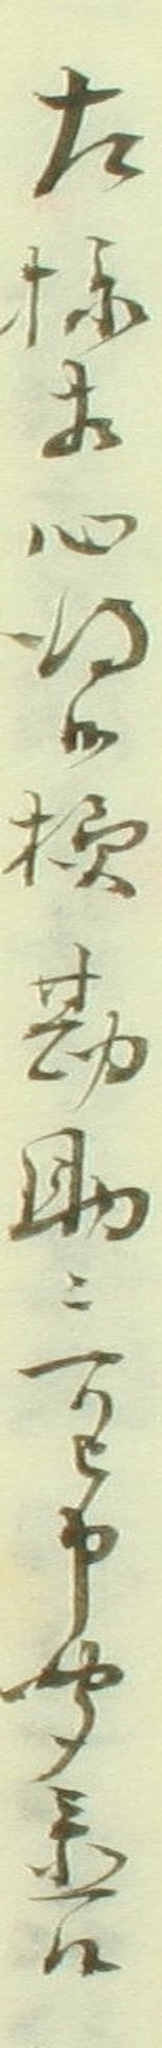左様相心得候様勘助に可被申聞置候
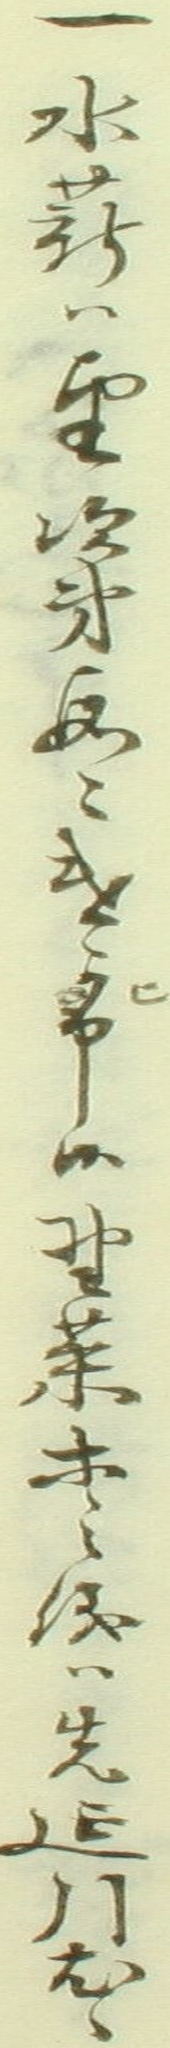一水薪は望次第段々遣可被申候野菜等之儀は先延引尤候
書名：異国船漂着記
